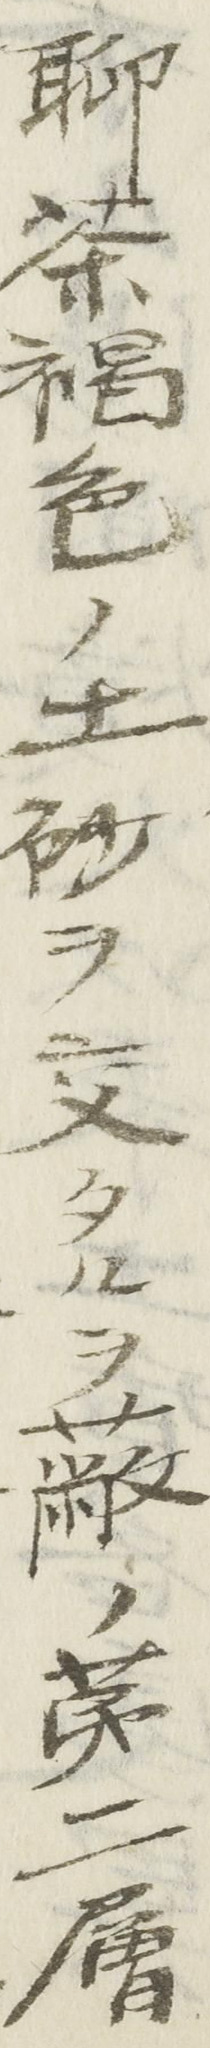聊茶褐色ノ土砂ヲ交タルヲ蔽ノ第二層
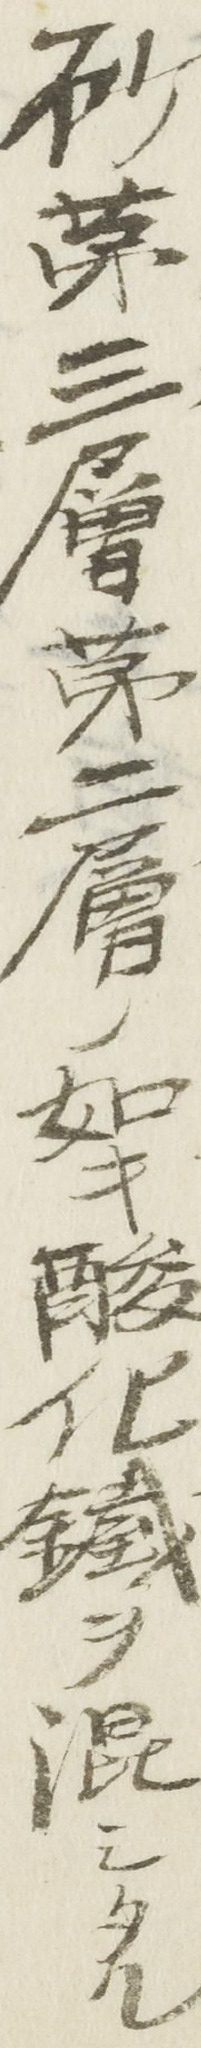砂第三層第二層ノ如キ酸化鉄ヲ混シタル
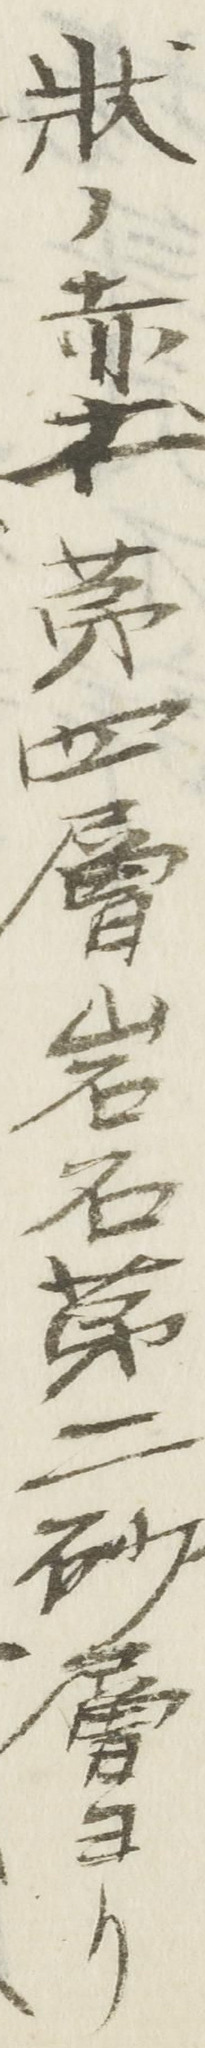状ノ赤土第四層岩石第二砂層ヨリ
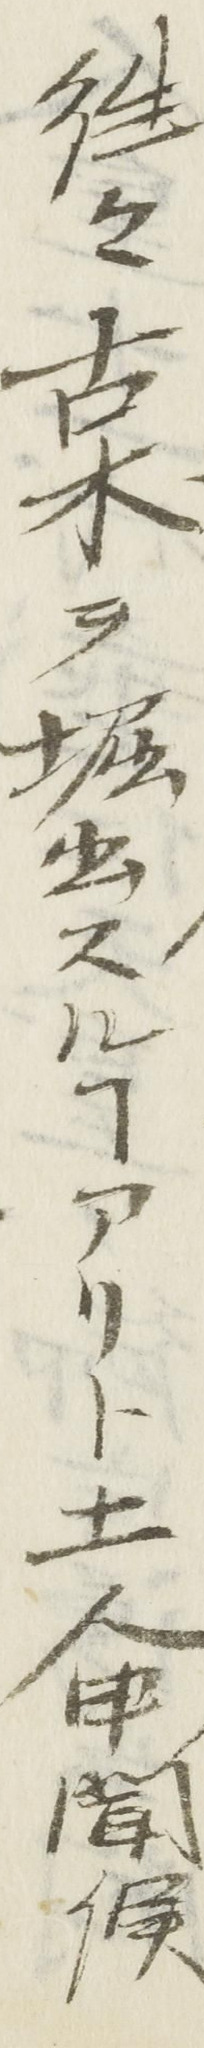往々古木ヲ掘出スルコトアリト土人申聞候
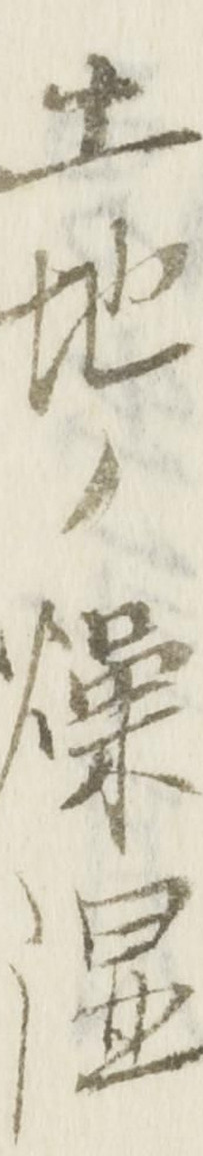土地ノ燥湿
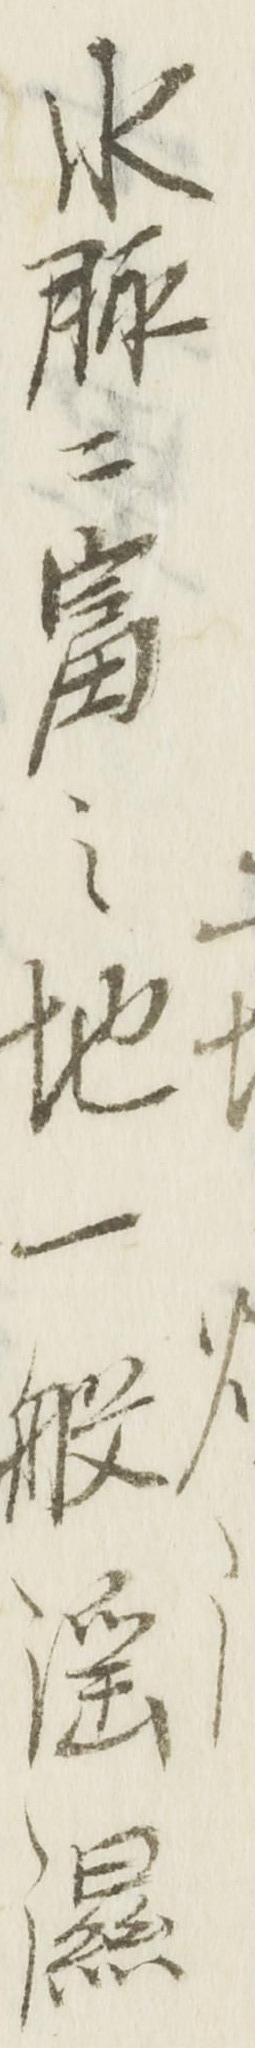水脈二富之地一般淫湿
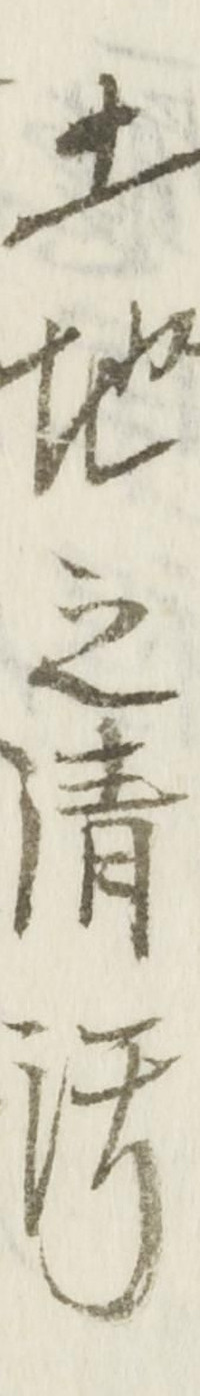土地ノ清汚
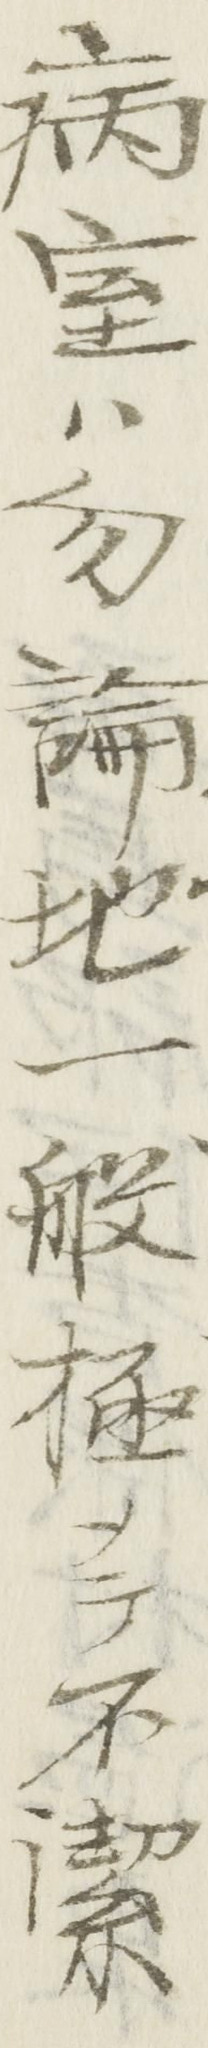病室ハ勿論地一般極メテ不潔
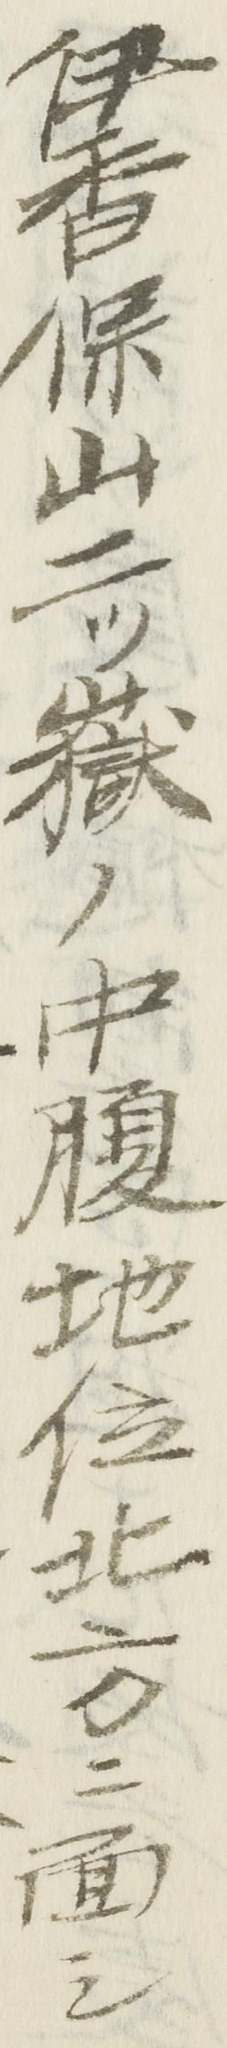伊香保山二ツ嶽ノ中腹地位北方ニ面シ
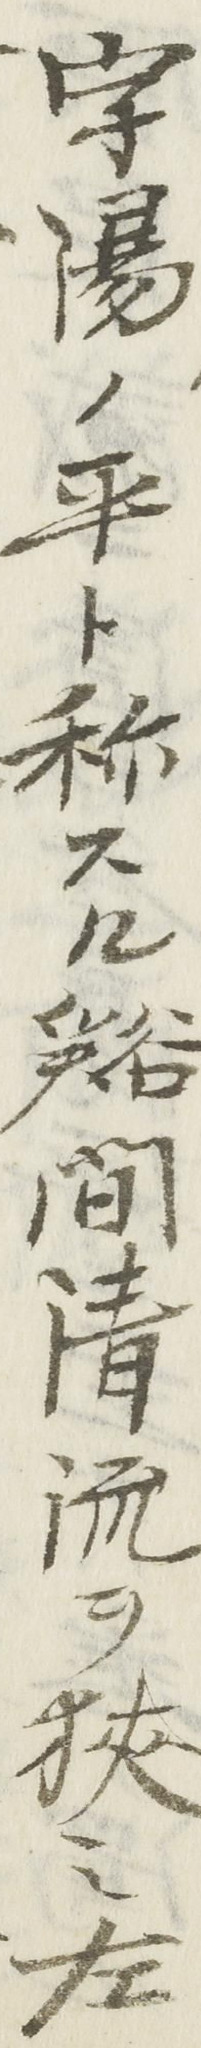字湯ノ平ト称スル谿間清流ヲ挟ミ左
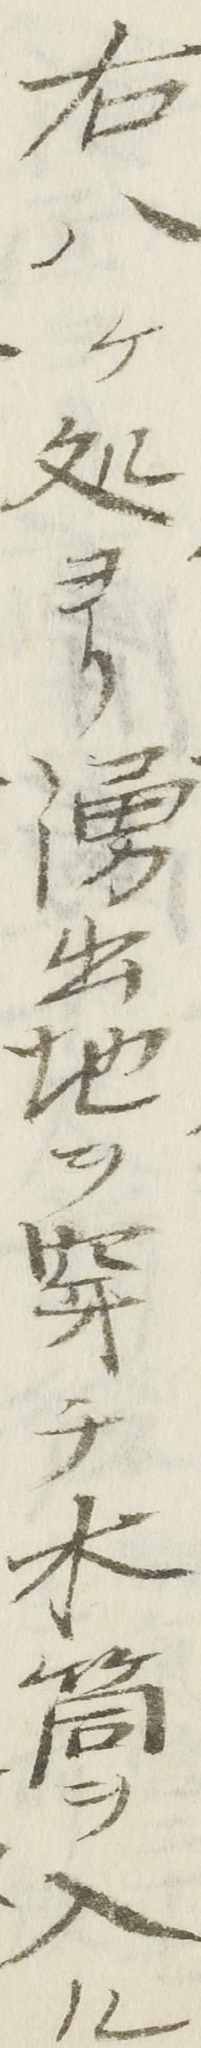右八ヶ処ヨリ湧出地ヲ穿チ水筒ヲ入ル
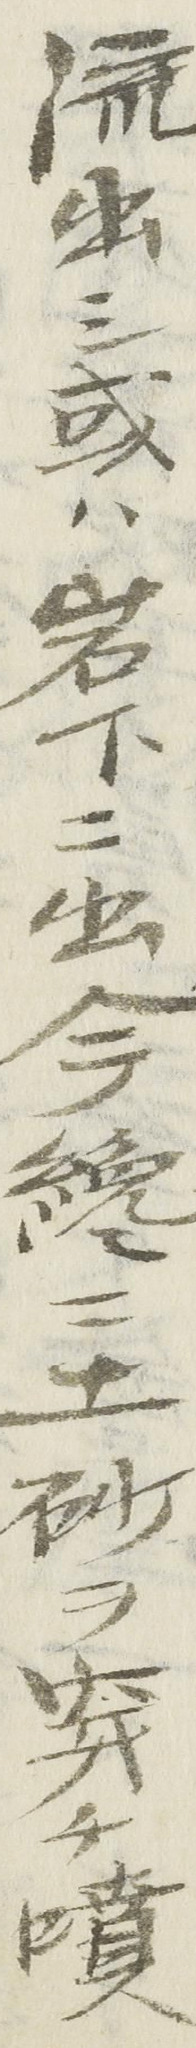流出シ或ハ岩下ニ出今纔二土砂ヲ穿チ噴
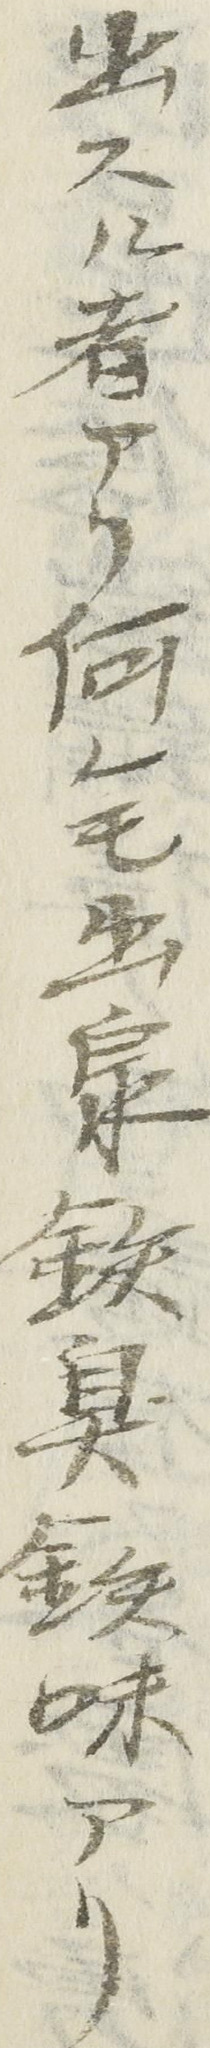出スル者アリ何レモ出泉鉄臭鉄味アリ

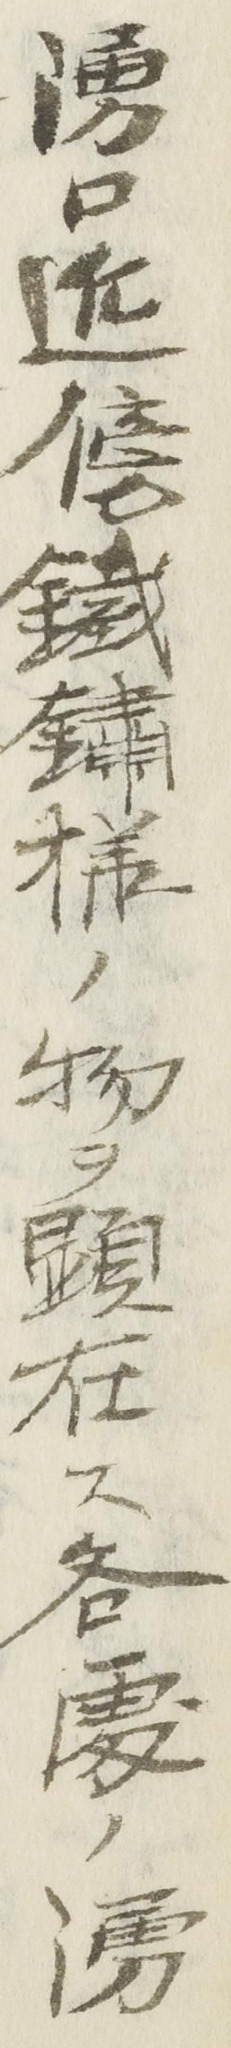湧口近傍鉄鏽様ノ物ヲ顕在ス各処ノ湧
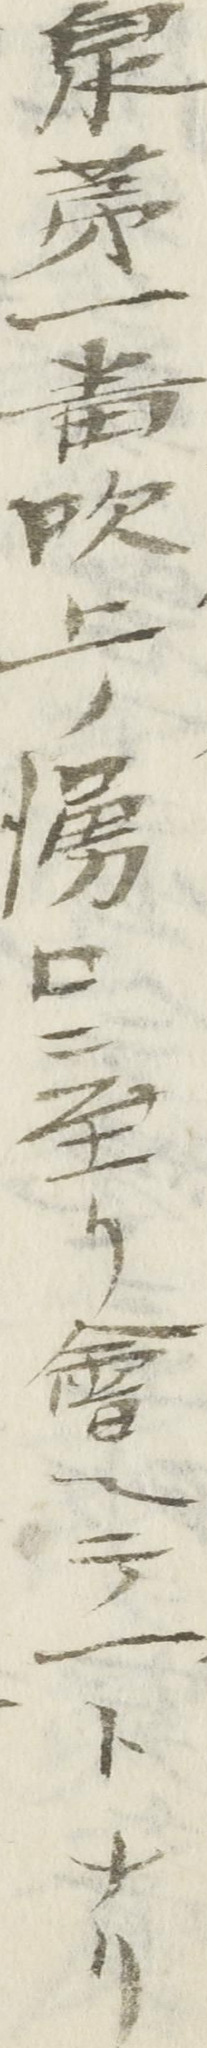泉第一番吹上ノ湧口ニ至リ会へテ一ナリ
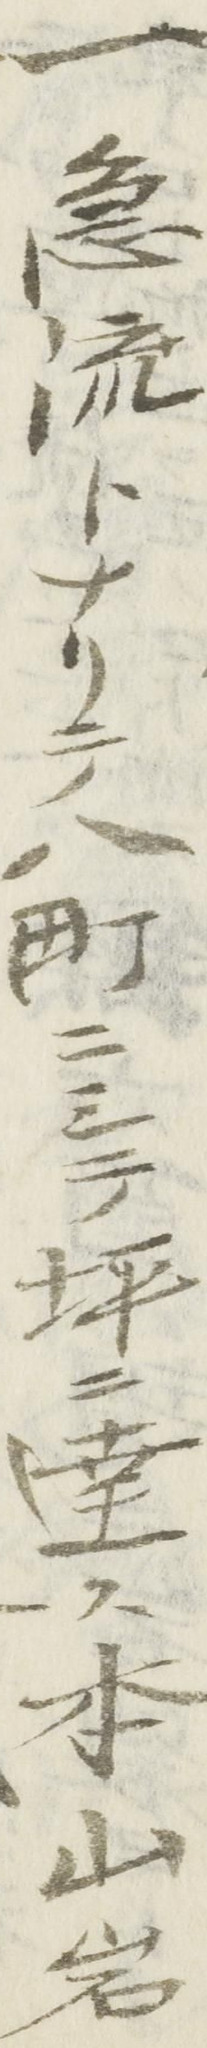一急流トナリテ八町ニシテ坪ニ達ス本山岩
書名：温冷泉試験表
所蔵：東京大学地震研究所図書室 Earthquake Research Institute Library, The University of Tokyo, JAPAN
